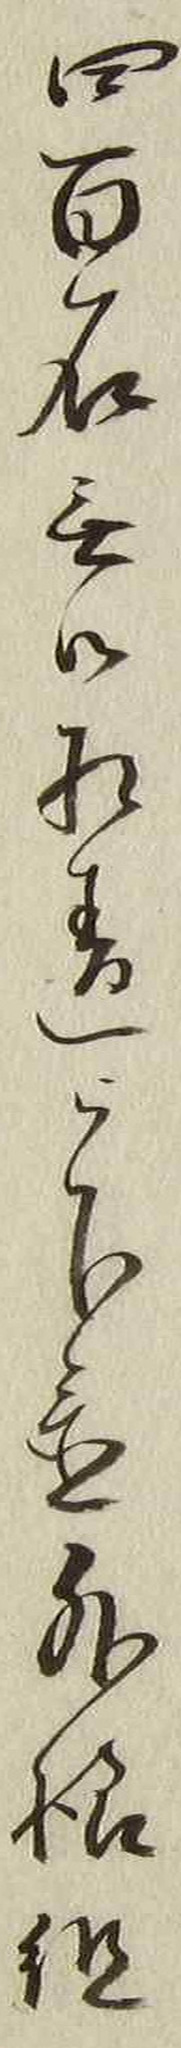四百石無御相違被下置外様組
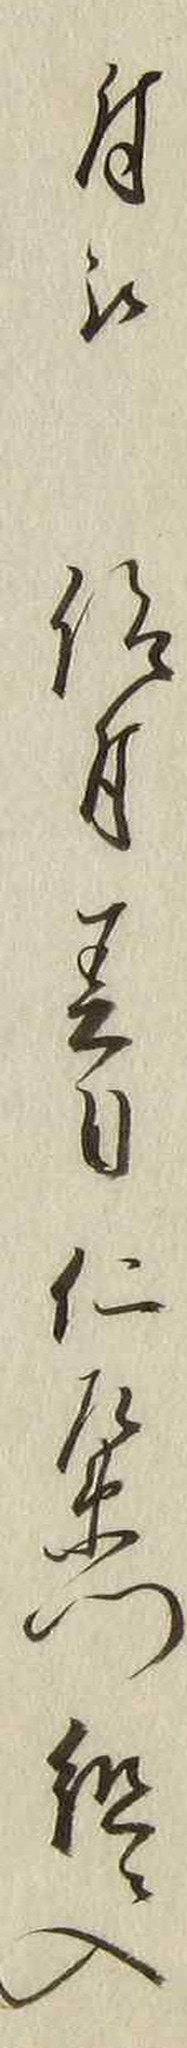付被仰付春日仁左衛門組にニ入
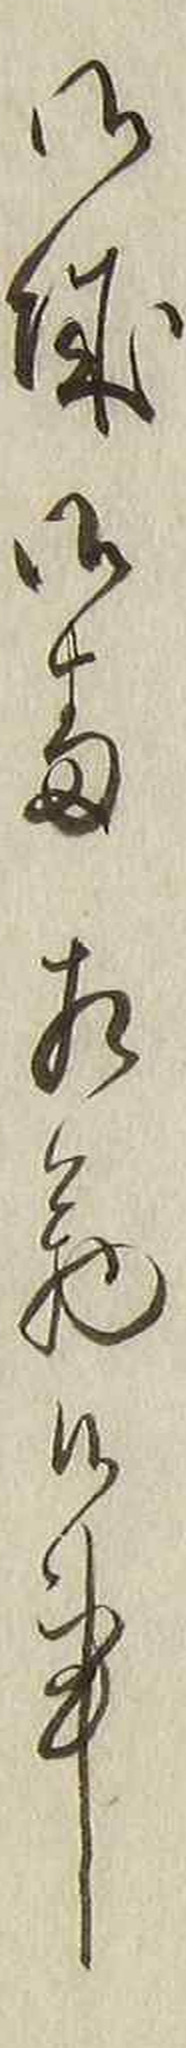御城御番相勤候事
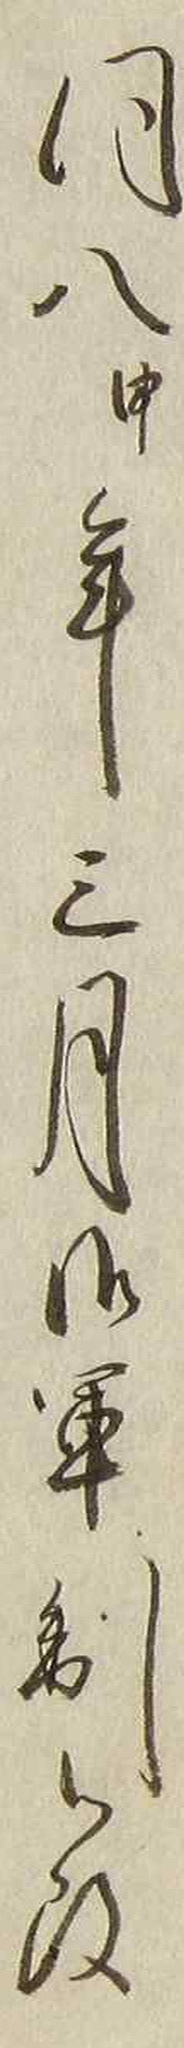同八申年三月御軍制御改
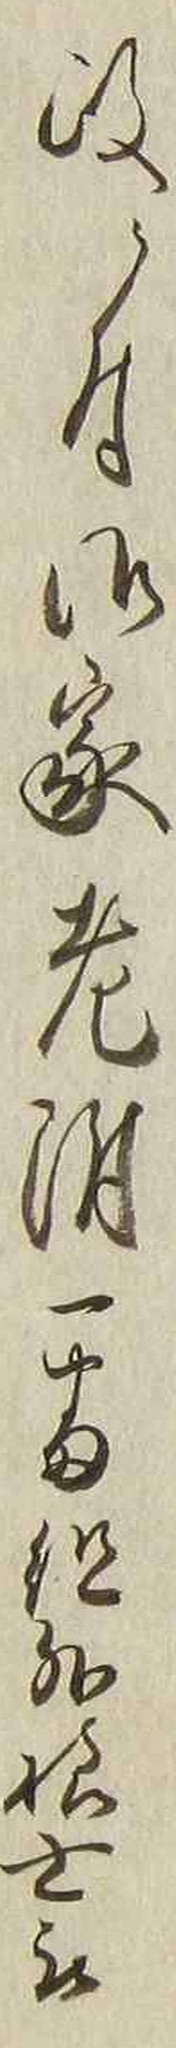政ニ付御家老附一番組外様士被

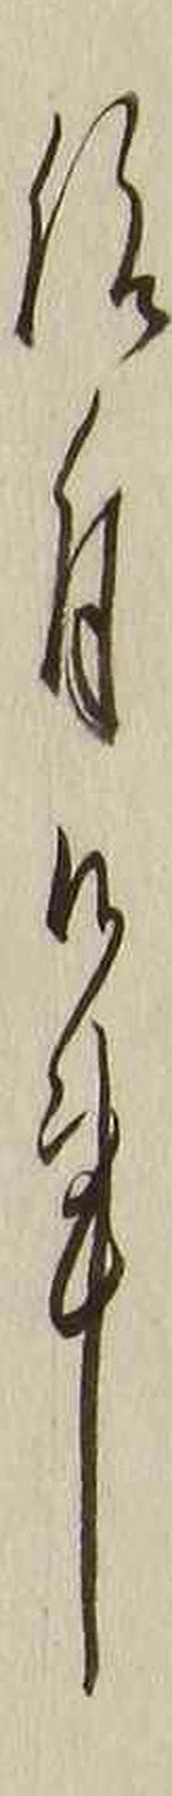仰付候事
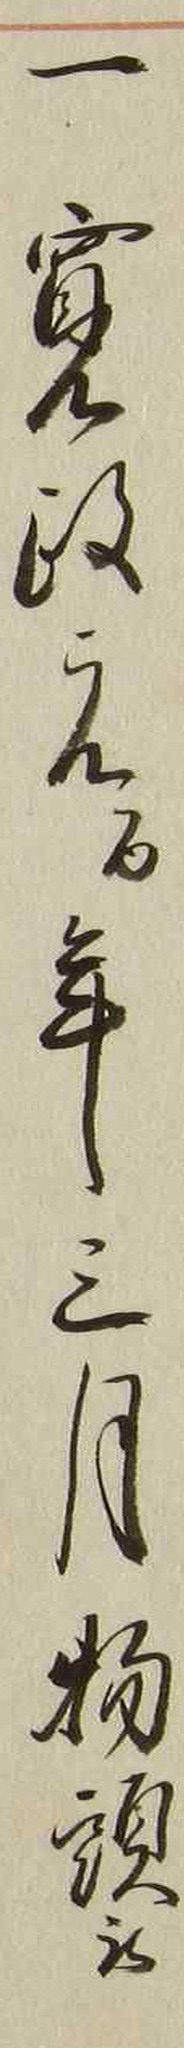一寛政元酉年三月物頭被
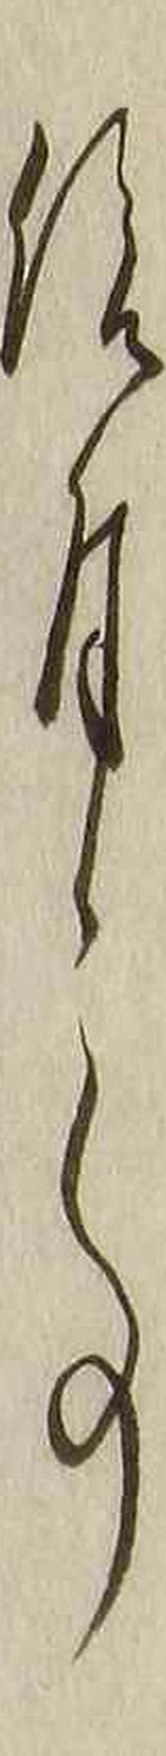仰付候事
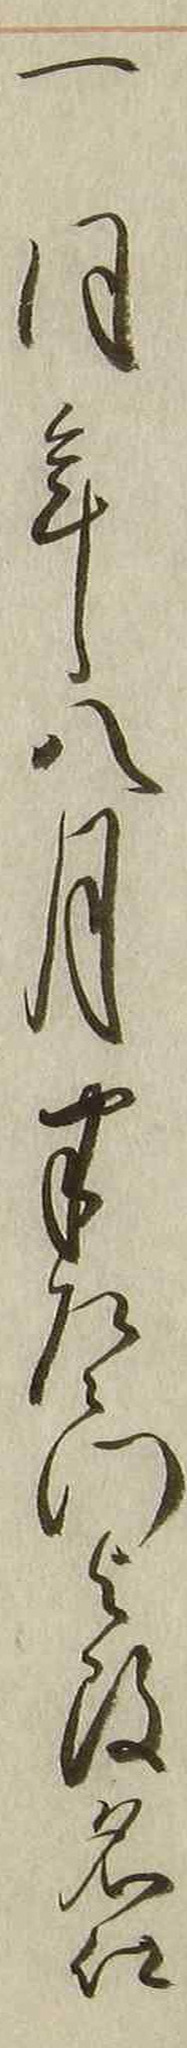一同年八月半左衛門と改名仕
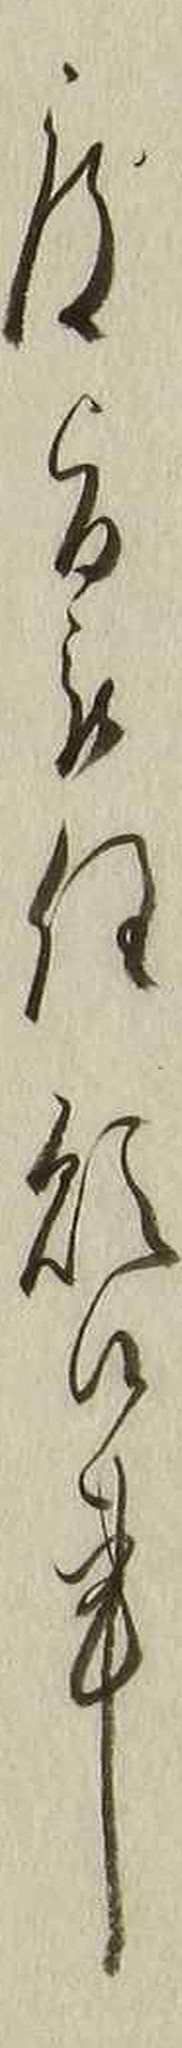度旨被任願候事
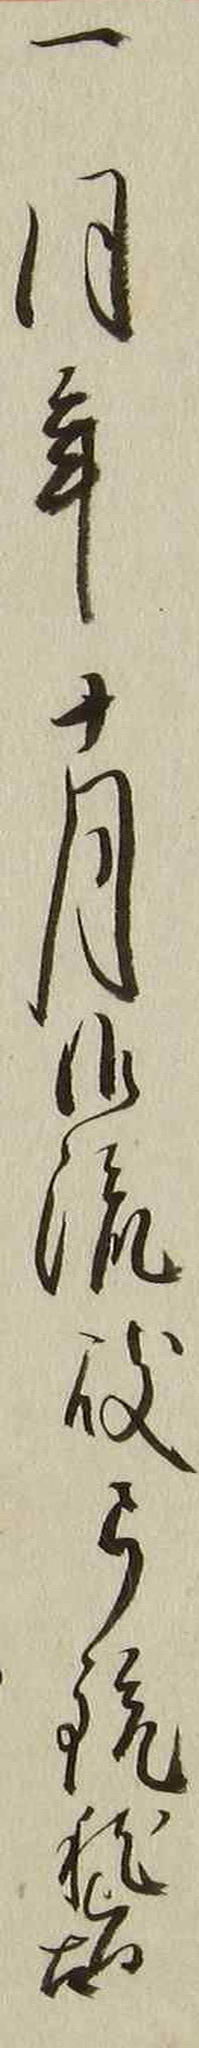一同年十月御流岐弓銃稽古
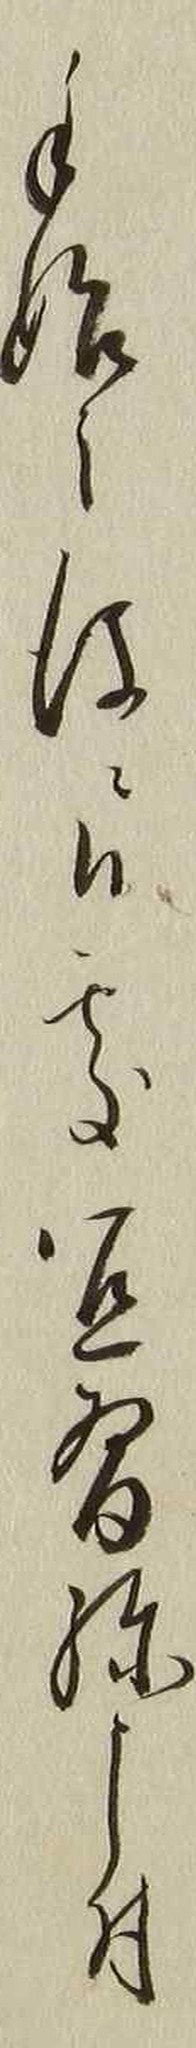手始之儀に候処宜習練申付
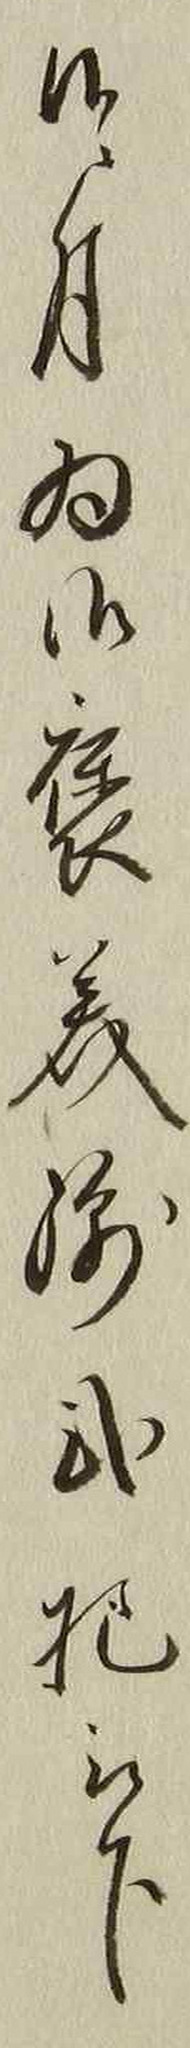候ニ付為御褒美綿弐把被下
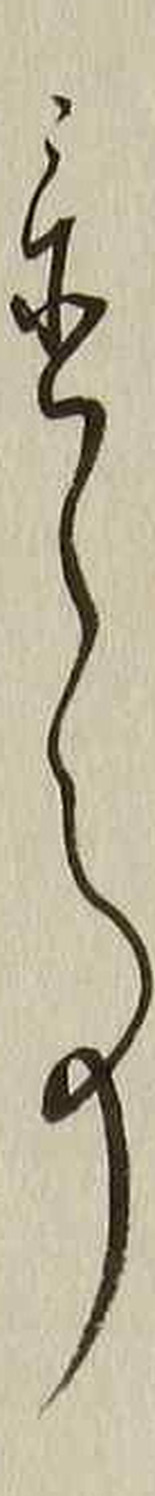置候事
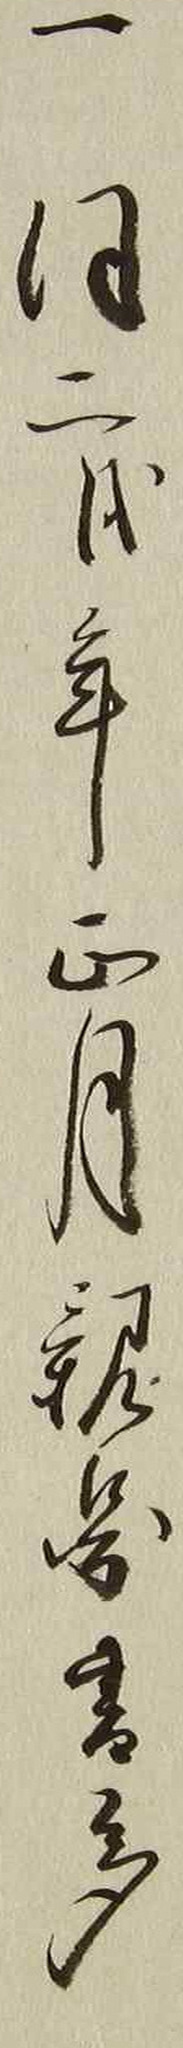一同二戌年正月親図書多
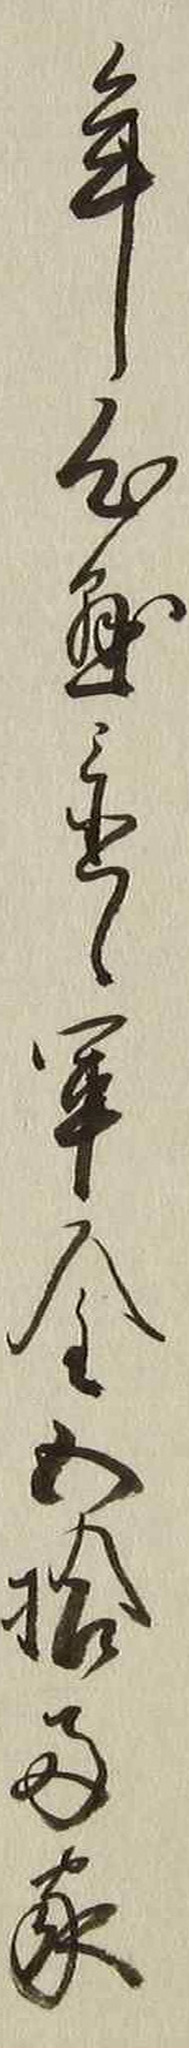事心懸置候軍金五拾両家
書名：諸士系譜　巻之18　い之部18
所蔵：会津若松市立会津図書館
